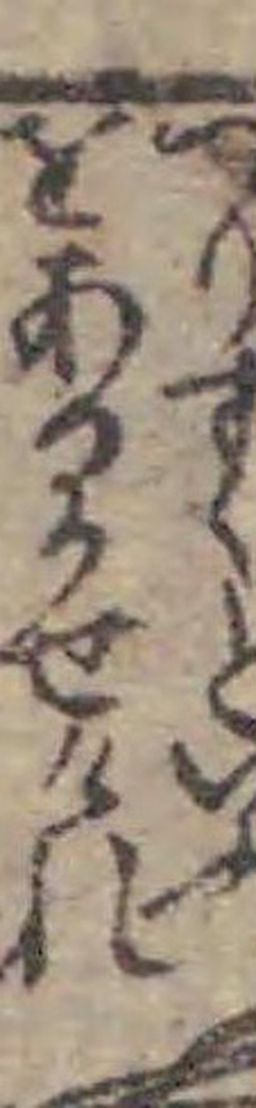をあるかせけれ
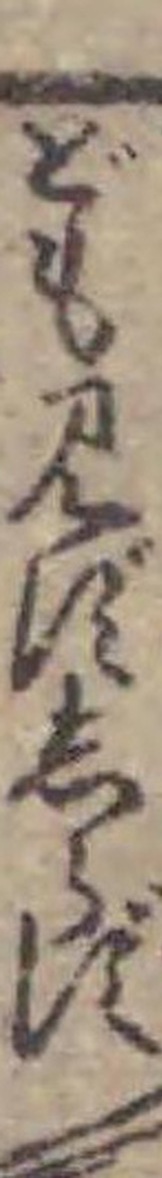ども見ずしらず
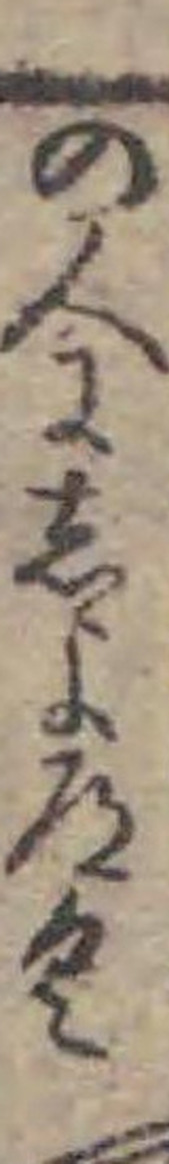の人にしよ道具
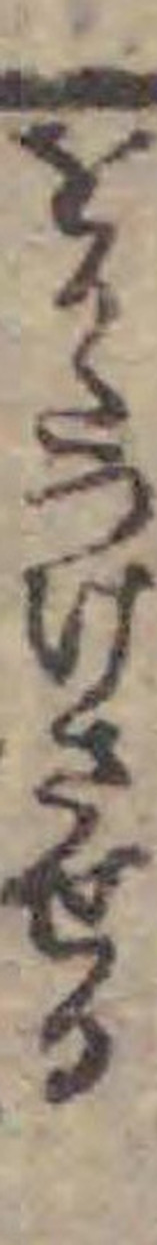をかたつけさせる
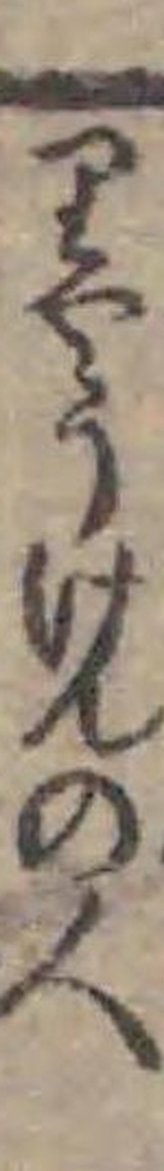りやうけんの人
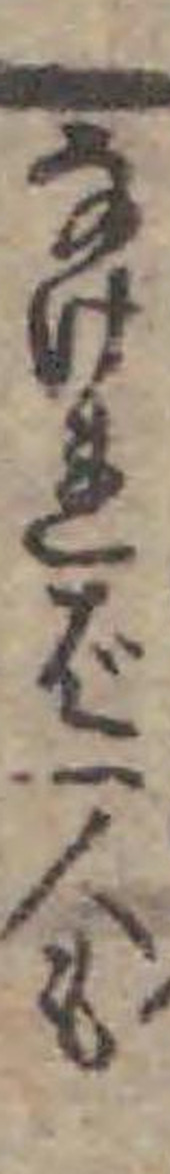なければ一人も
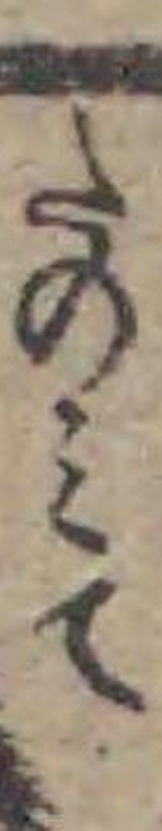たのみて
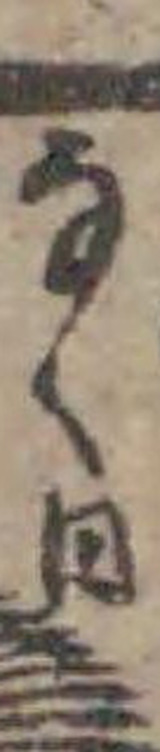なく日
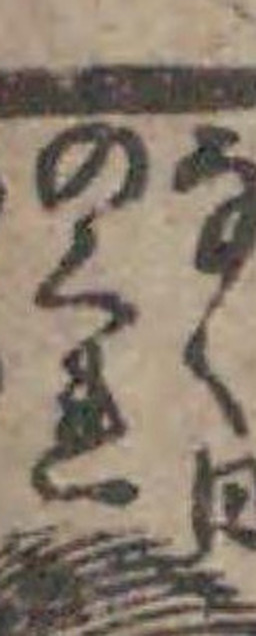のくれ
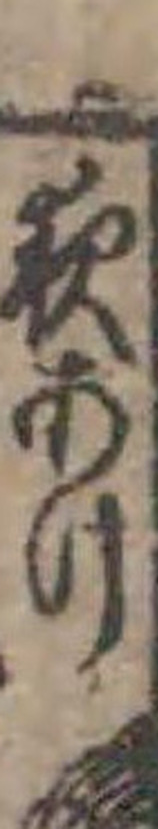夜あけ
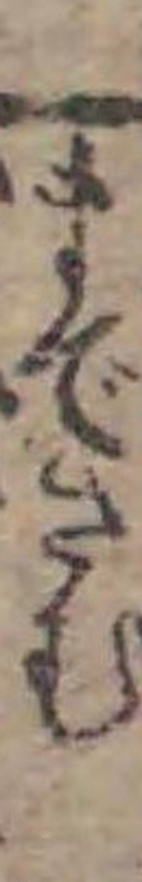までさむ
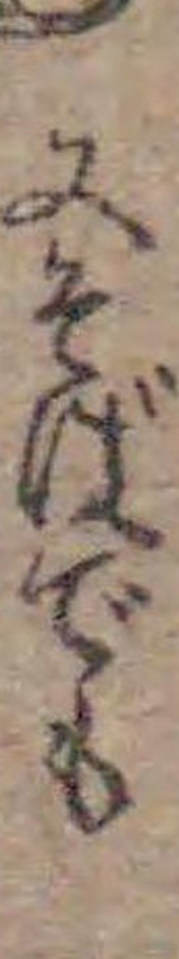又そばでも
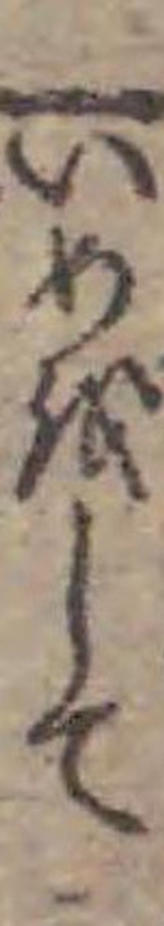いめをして
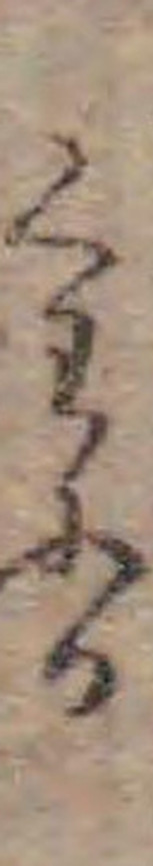くわふか
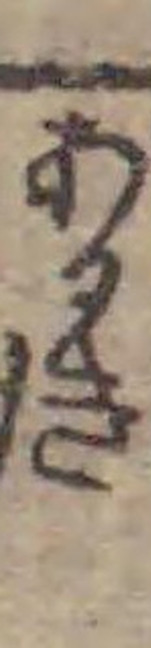あるき
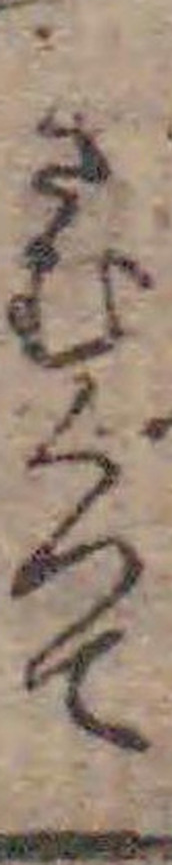さむくつて
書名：本樹真猿浮気噺 : 3巻
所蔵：国立国会図書館 National Diet Library, JAPAN
